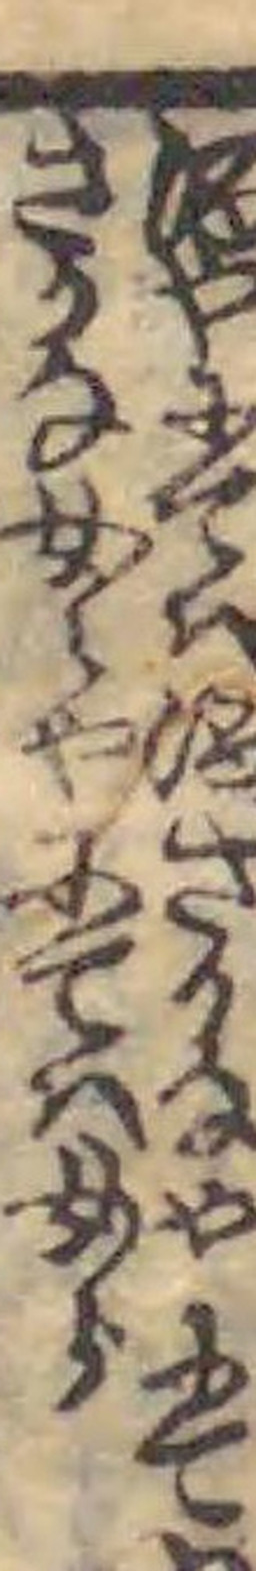さかな女郎やにては女郎
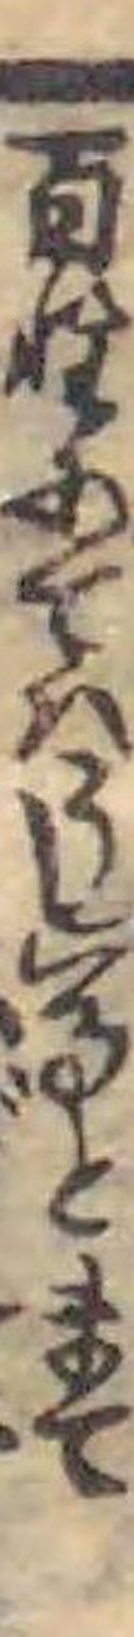百姓にてはうし馬とまて
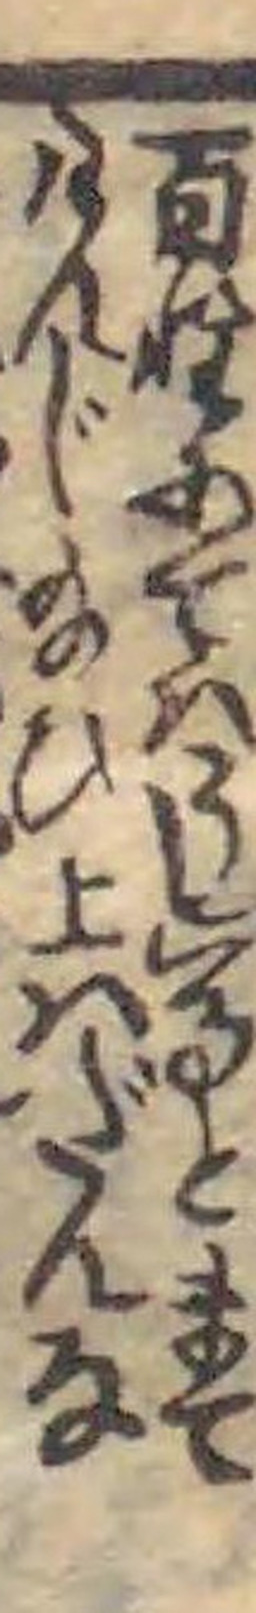けんじ給ひ上はだんな
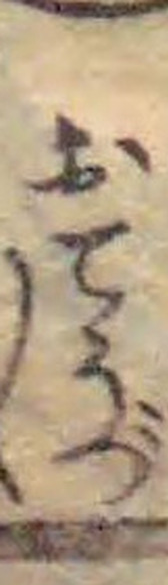おてうづ
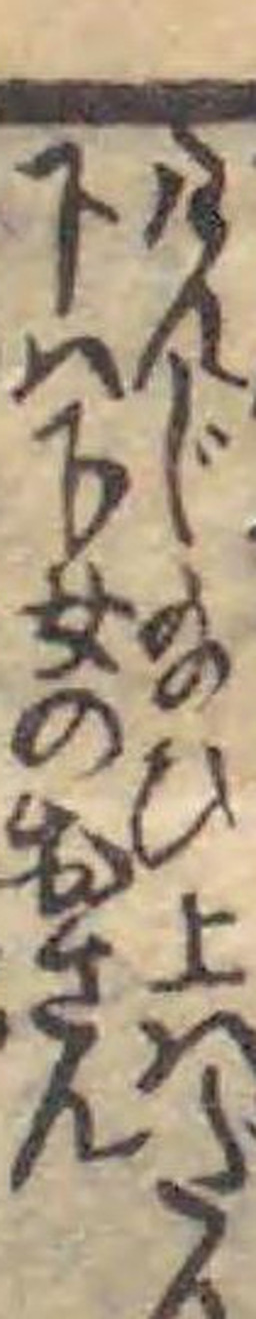下は下女のおさん
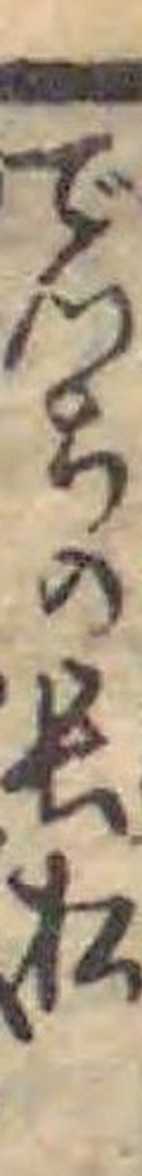でつちの長松
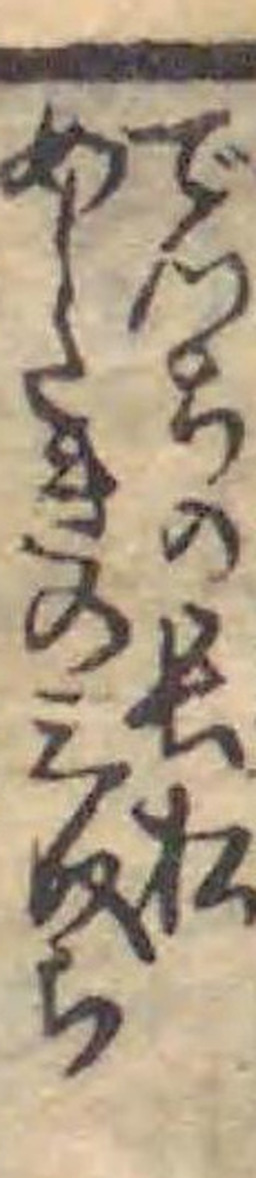めしたけいの三介ら
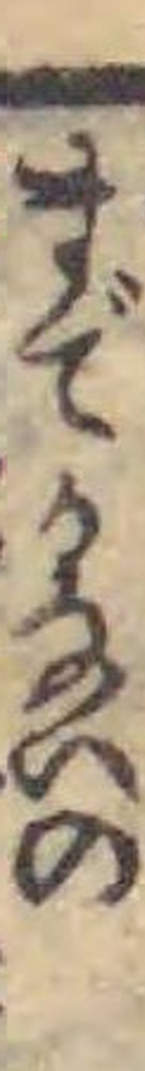までかないの
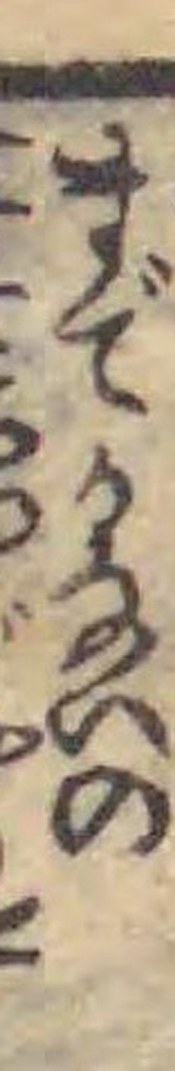までかないの
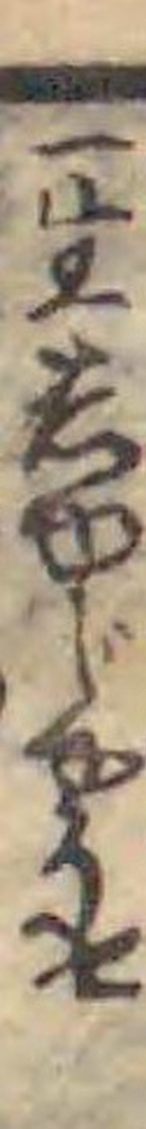一生しゆじやうを
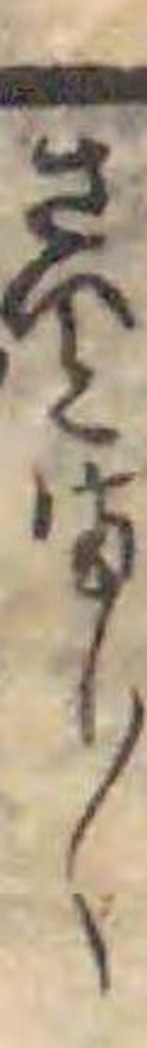さいとまし〳〵
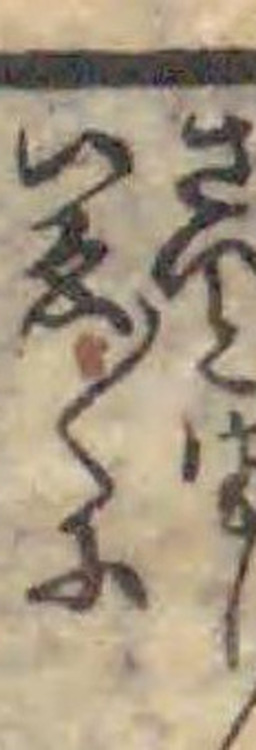いゑ〳〵に
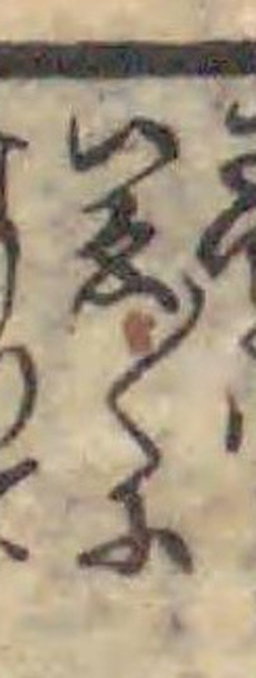いゑ〳〵に
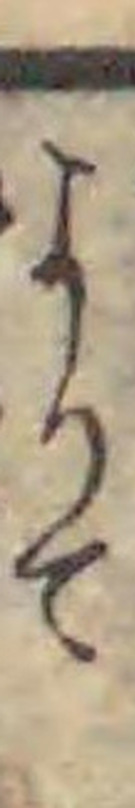よりて
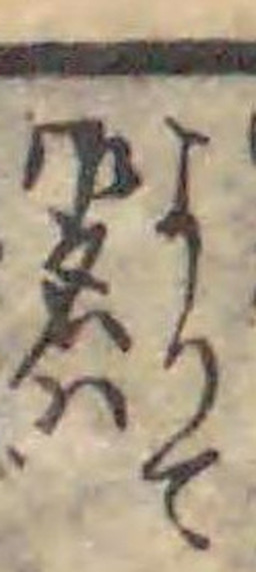御名は
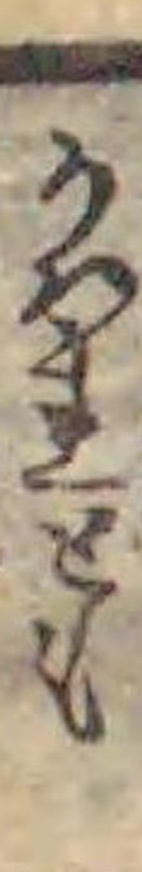かはれども
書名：身体開帳略縁起 : 3巻
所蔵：国立国会図書館 National Diet Library, JAPAN
